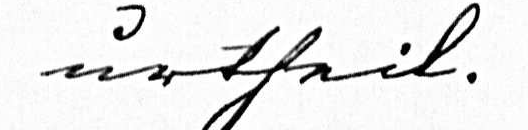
urtheil.
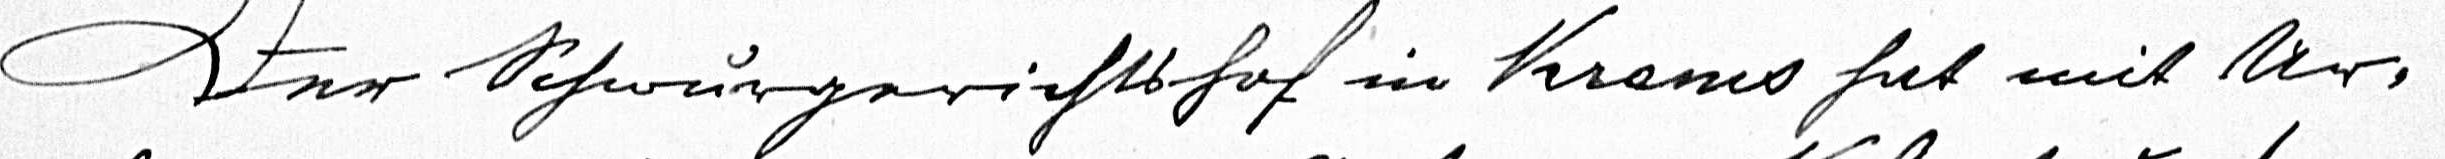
Der Schwurgerichtshof in Krems hat mit Ur¬
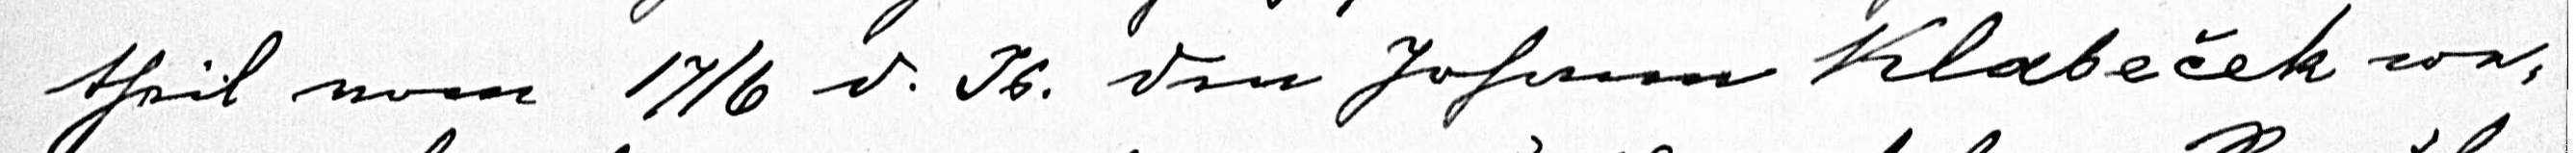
theil vom 17/6 d. Js. den Johann Klabeček we¬
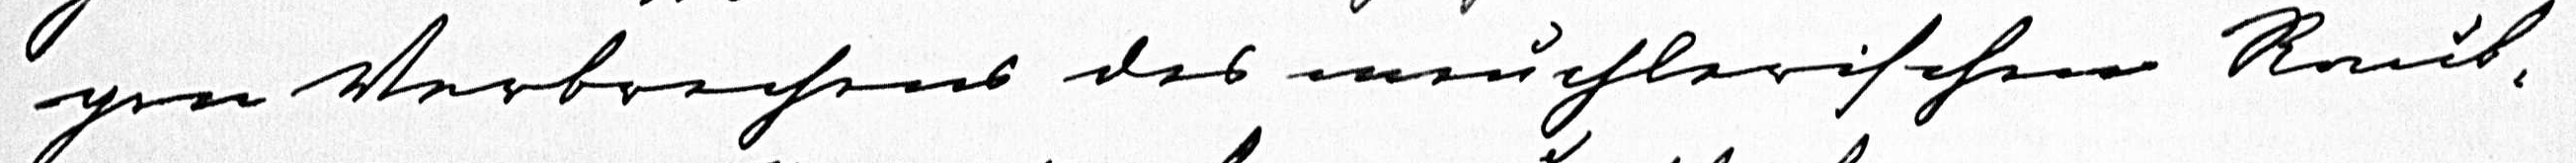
gen Verbrechens des meuchlerischen Raub¬
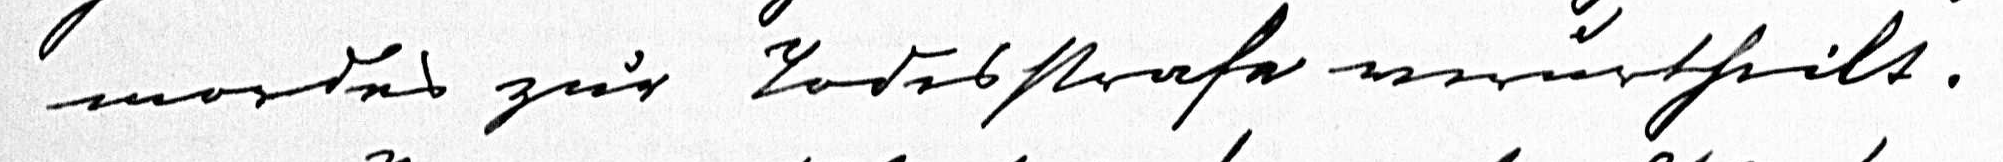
mordes zur Todesstrafe verurtheilt.
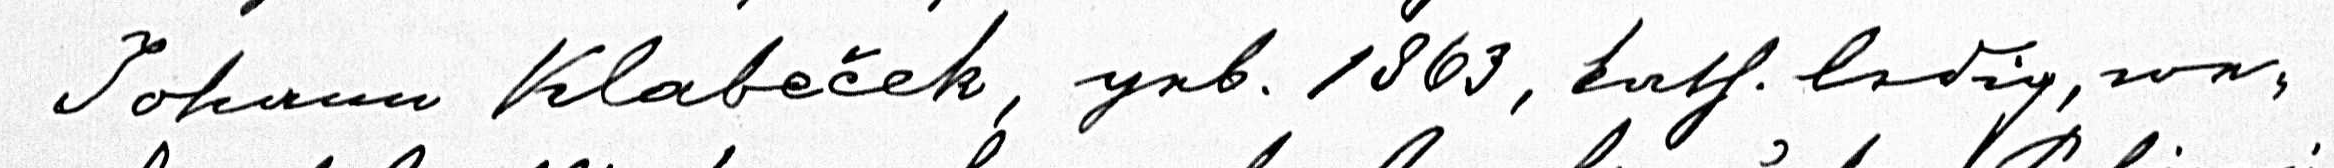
Johann Klabeček, geb. 1863, kath. Ledig, we¬
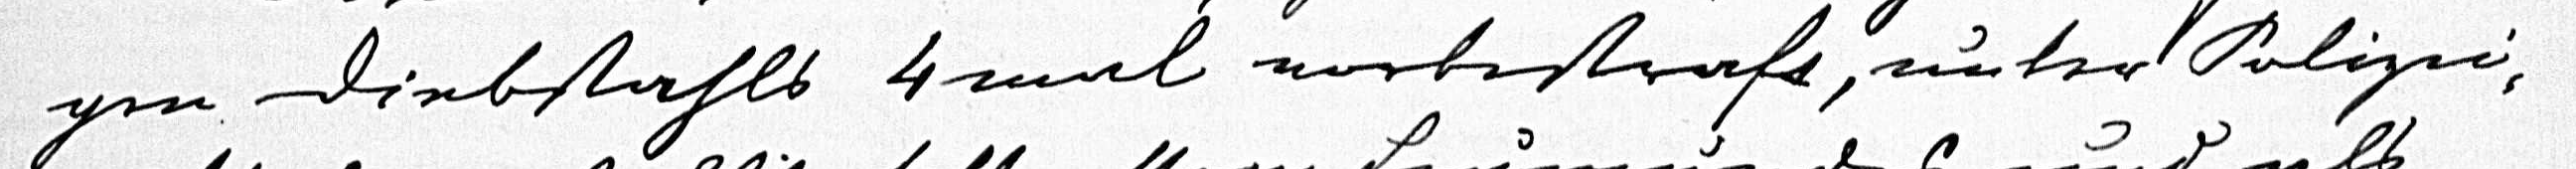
gen Diebstahls 4mal vorbestraft, unter Polizei¬
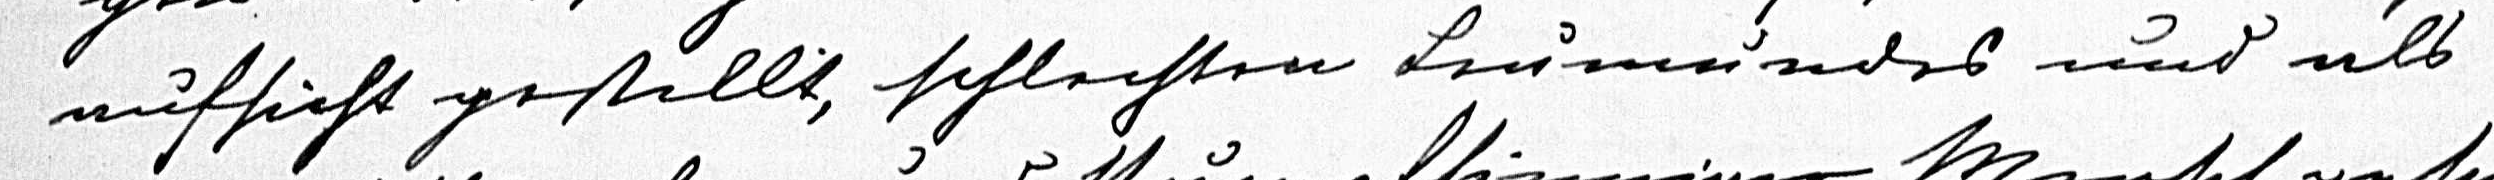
aufsicht gestellt, schlechten Leumundes und als
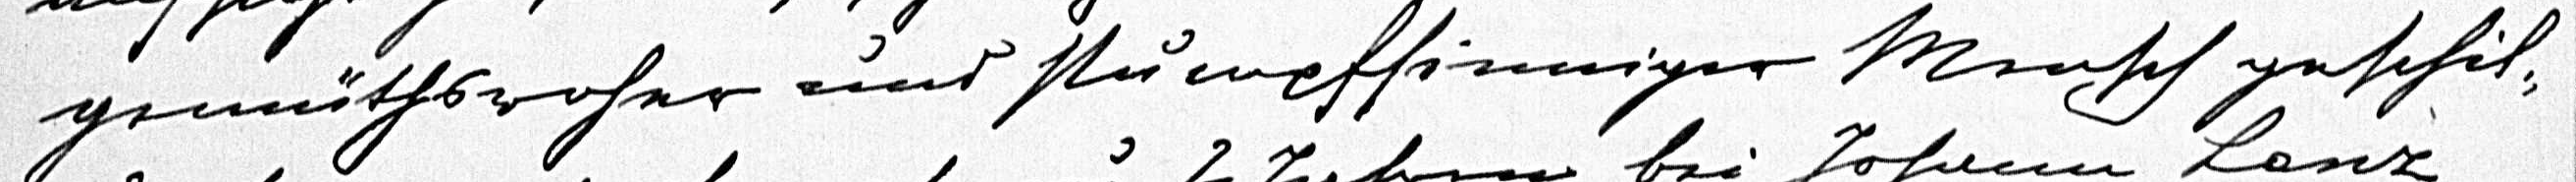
gemüthsroher und stumpfsinniger Mensch geschil¬
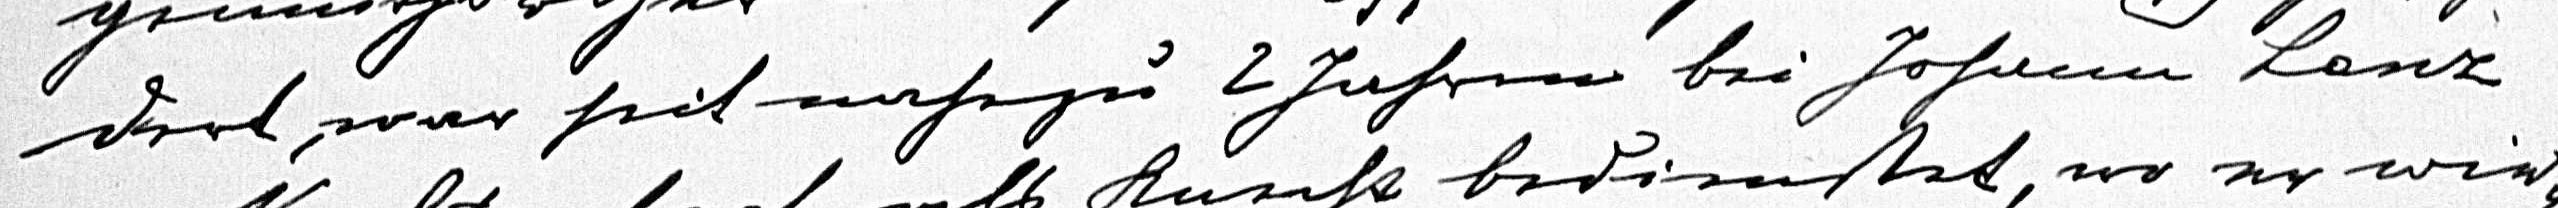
dert, war seit nahezu 2 Jahren bei Johann Lenz
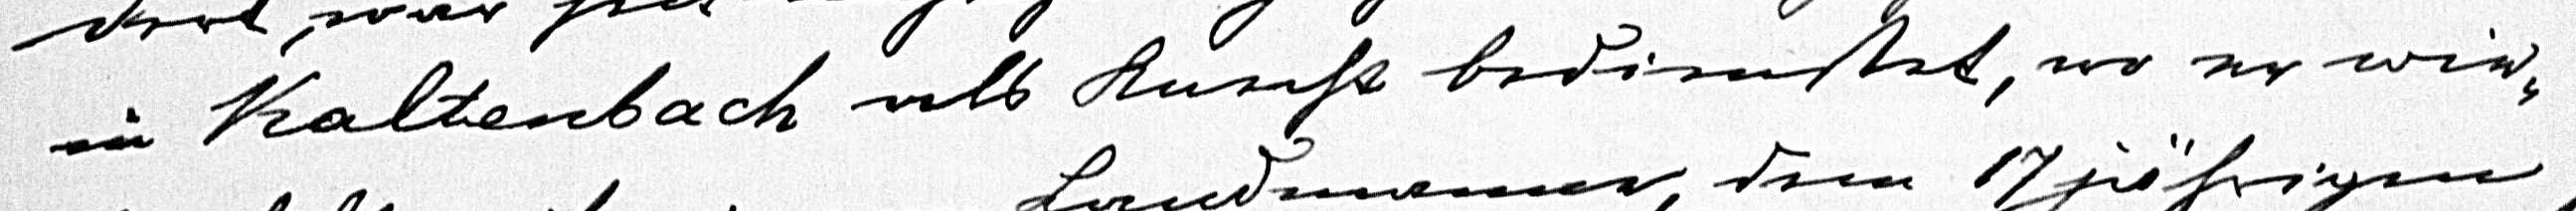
in Kaltenbach als Knecht bedienstet, wo er wie¬
